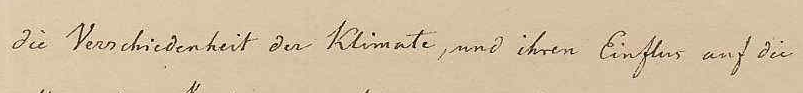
die Verschiedenheit der Klimate, und ihren Einflus auf die
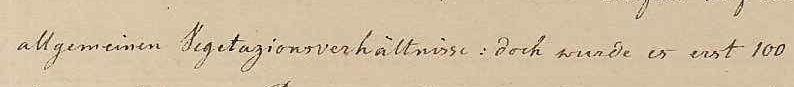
allgemeinen Vegetazionsverhältnisse: doch wurde es erst 100
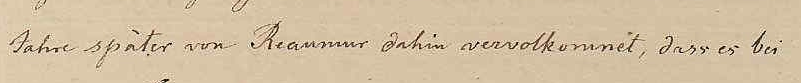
Jahre später von Reaumur dahin vervolkomnet, dass es bei
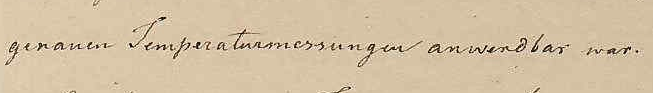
genauen Temperaturmessungen anwendbar war.
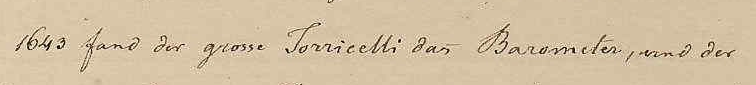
1643 fand der grosse Torricelli das Barometer, und der
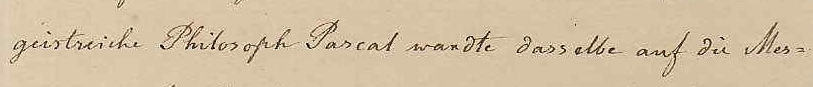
geistreiche Philosoph Pascal wandte dasselbe auf die Mes-
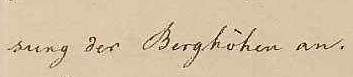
sung der Berghöhen an.
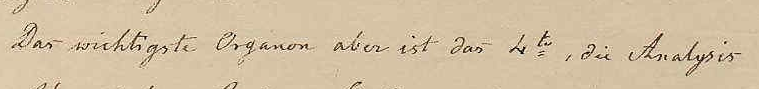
Das wichtigste Organon aber ist das 4te, die Analysis
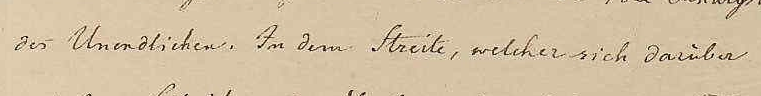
des Unendlichen. In dem Streite, welcher sich darüber
